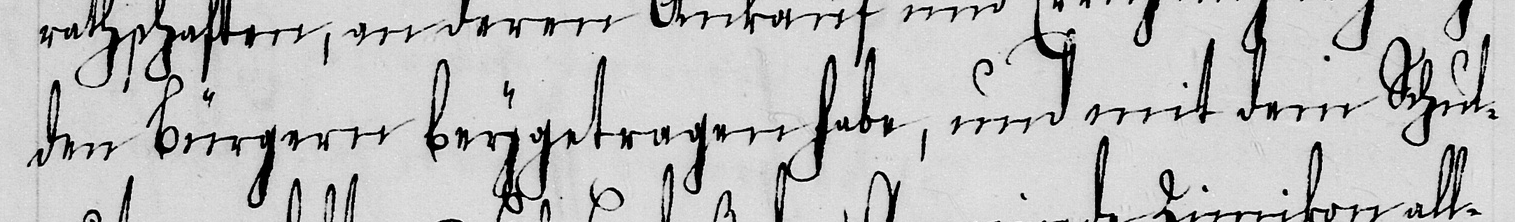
den Bürgern beygetragen habe, und mit dem Schul¬
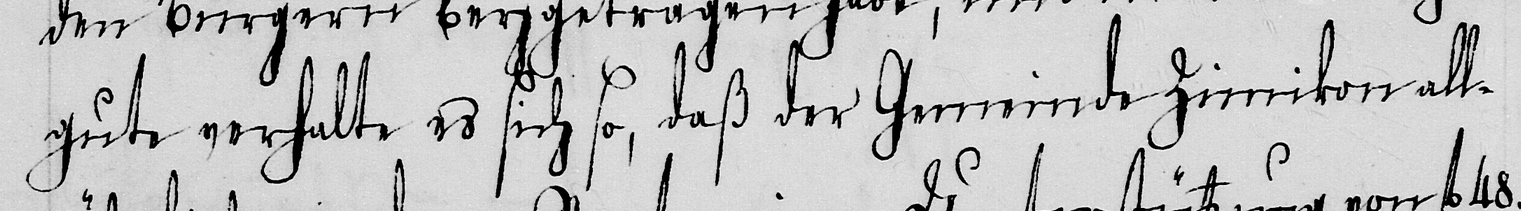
gute verhalte es sich so, daß der Gemeinde Zimikon all¬
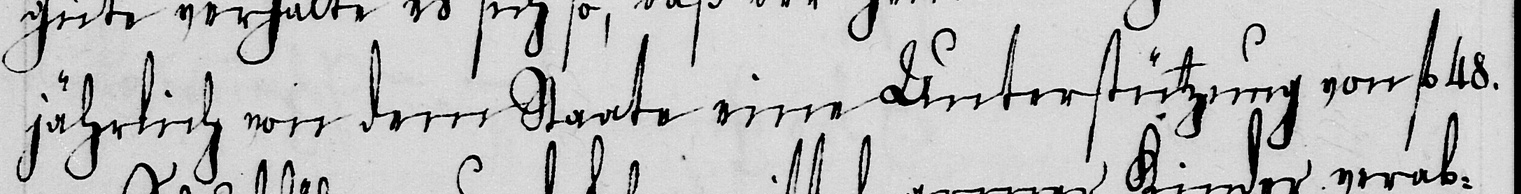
fährlich von dem Staate eine Unterstützung von fl.
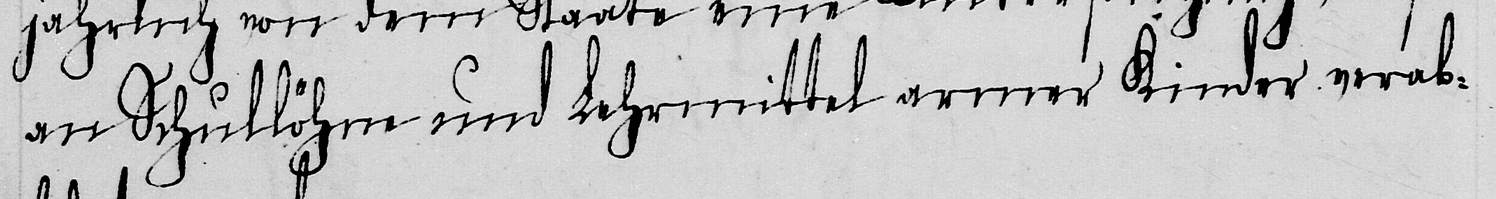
an Schullöhne und Lehrmittel armer Kinder verab¬
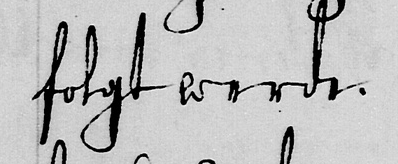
folgt werde.
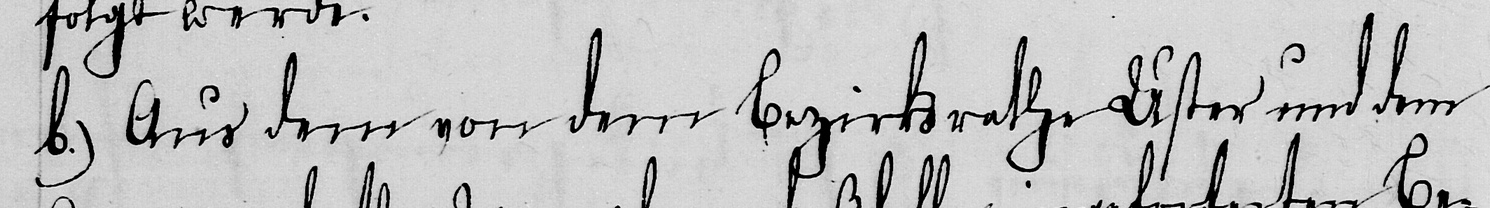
b.) Aus dem von dem Bezirksrathe Uster und dem
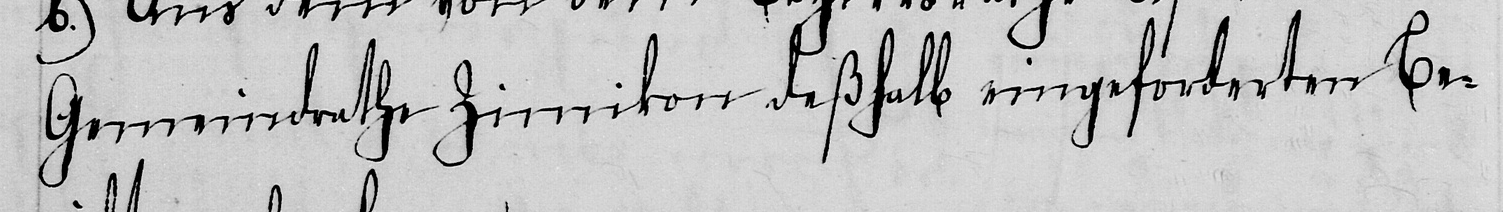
Gemeindrathe Zimikon deßhalb eingeforderten Be¬
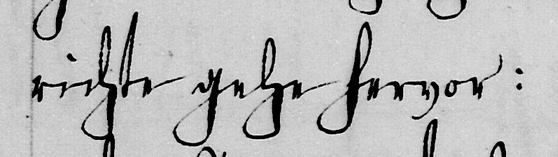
richte gehe hervor:
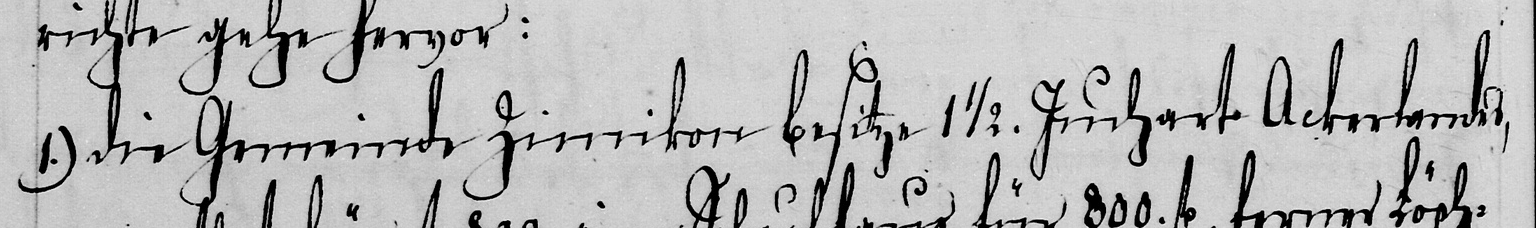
1.) die Gemeinde Zimikon besitze 11/2. Juchart Ackerlandes,
